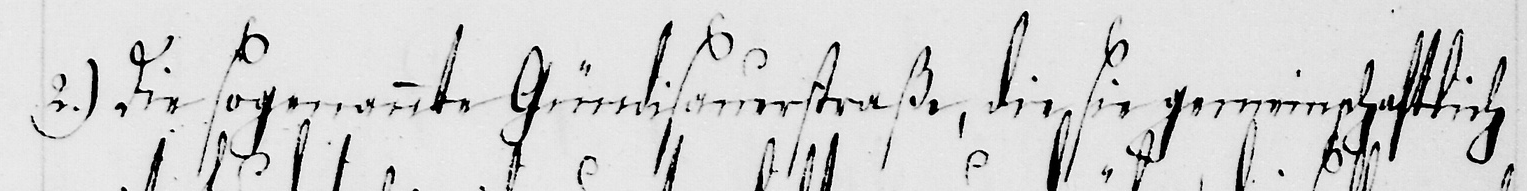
2.) Die sogenannte Gündisauerstraße, die sie gemeinschaftlich
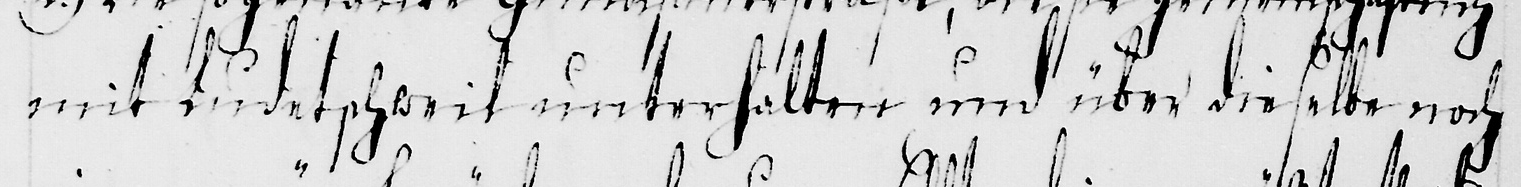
mit Ludetschweil unterhalten und über die selbe noch
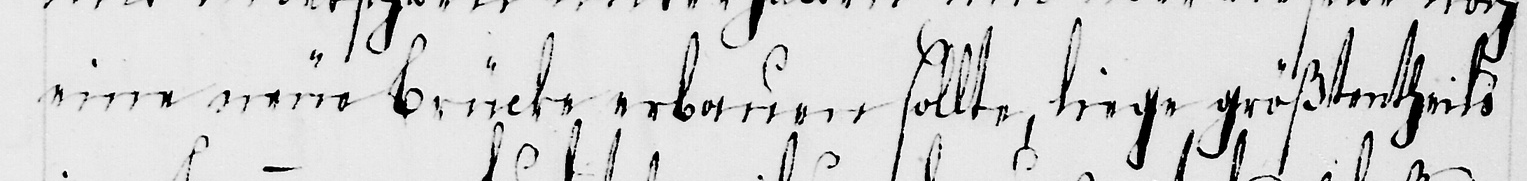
eine neue Brücke erbauen sollte, liege größtentheils
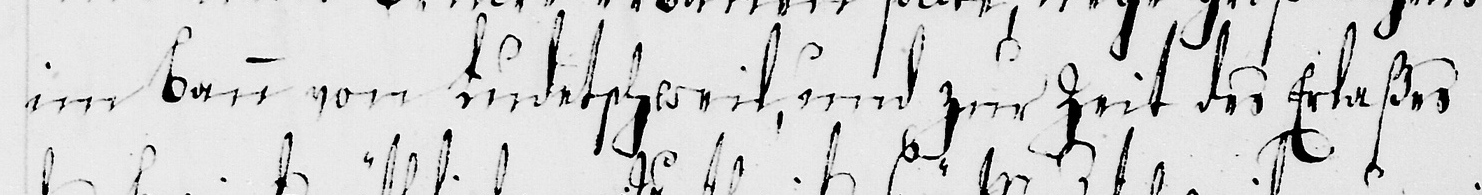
im Bann von Ludetschweil, und zur Zeit des Erlaßes
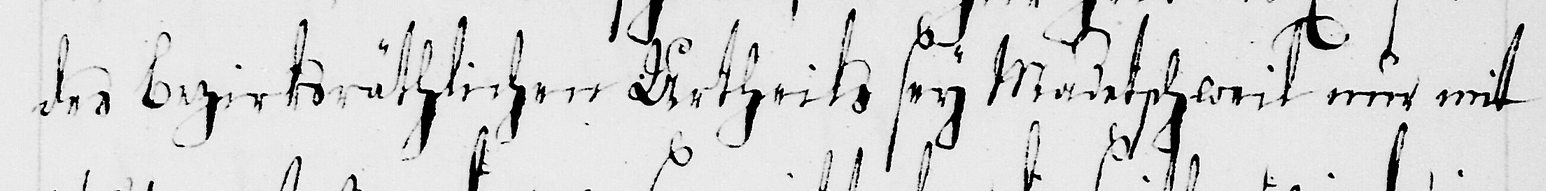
des Bezirksräthlichen Urtheils sey Madetschweil nur mit
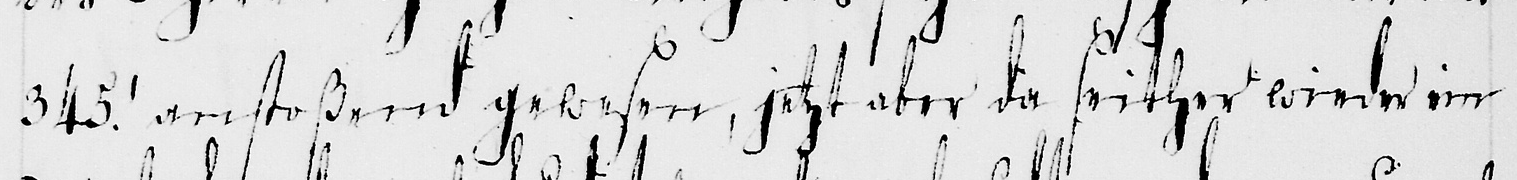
345’. anstoßend gewesen, jetzt aber da seither wieder ein
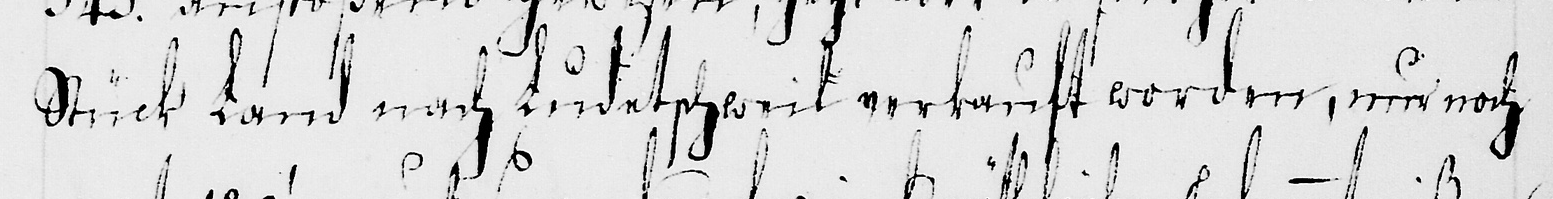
Stück Land nach Ludetschweil verkauft worden, nur noch
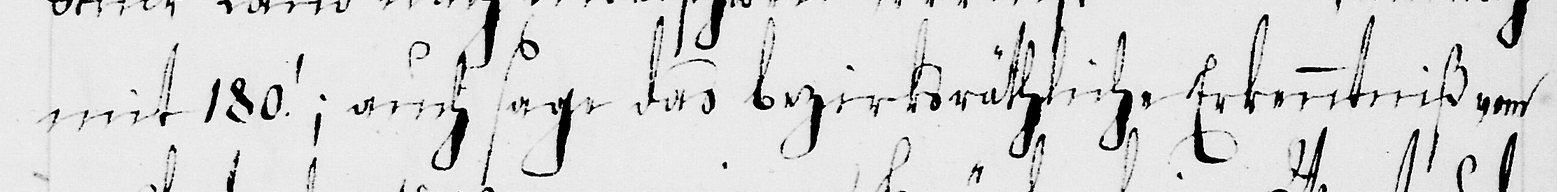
mit 180’.; auch sage das Bezirksräthliche Erkenntniß vom
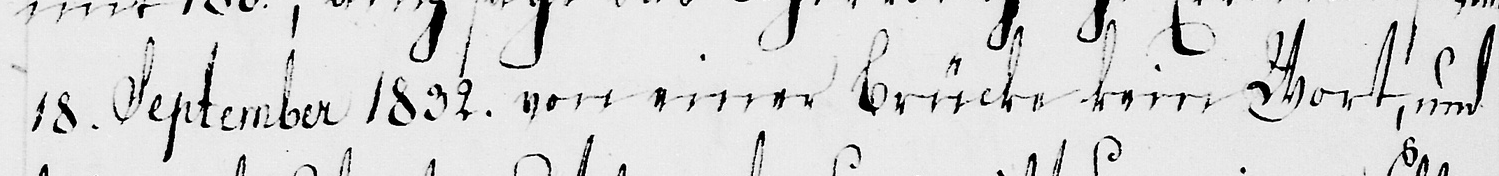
18. September 1832. von einer Brücke kein Wort, und
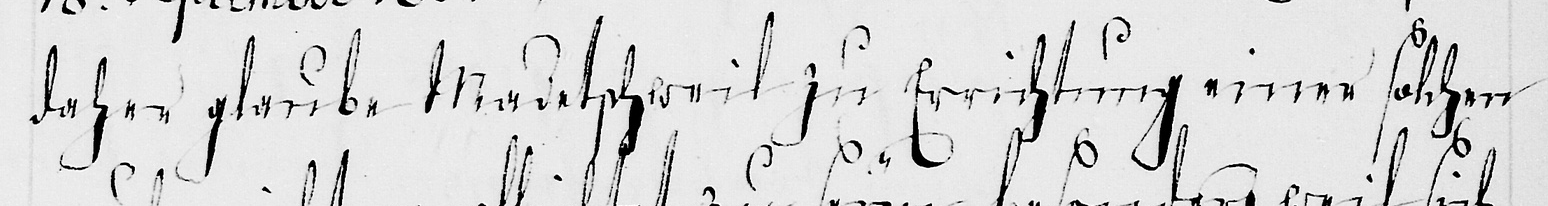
daher glaube Madetschweil zu Errichtung einer solchen
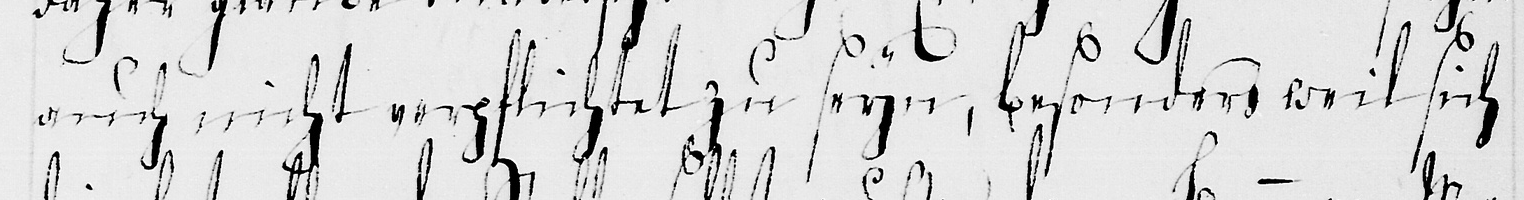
auch nicht verpflichtet zu seyn, besonders weil sich
